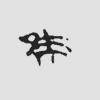隹
